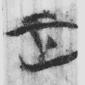正
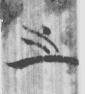之
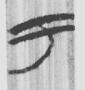于
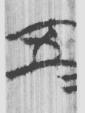五=
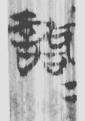詒=
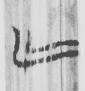亡
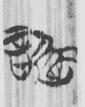誳
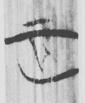正
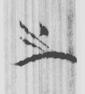之
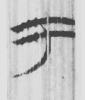于
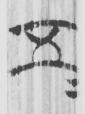五=
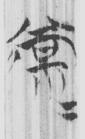常=
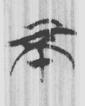不
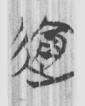逾
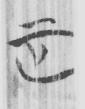正
